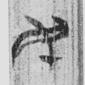民
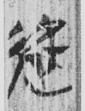○（登）
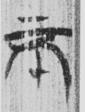不
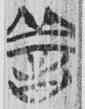善
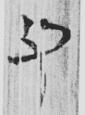父
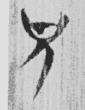兄
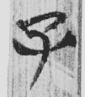子
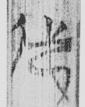俤（弟）
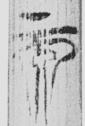而
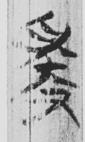爯（稱）
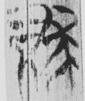賕
